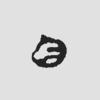百
